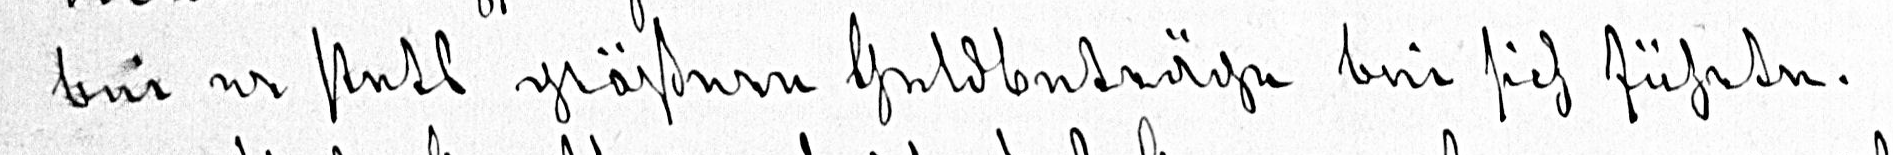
bei er stets größere Geldbeträge bei sich führte.
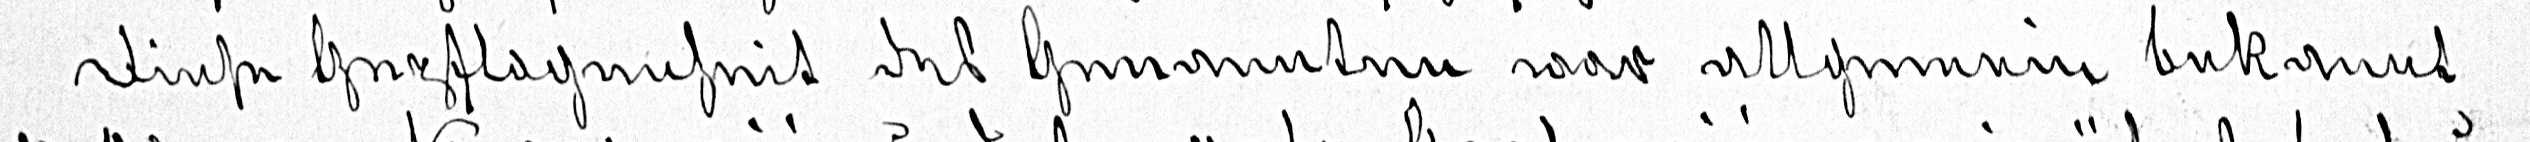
Diese Gepflogenheit des Genannten war allgemein bekannt
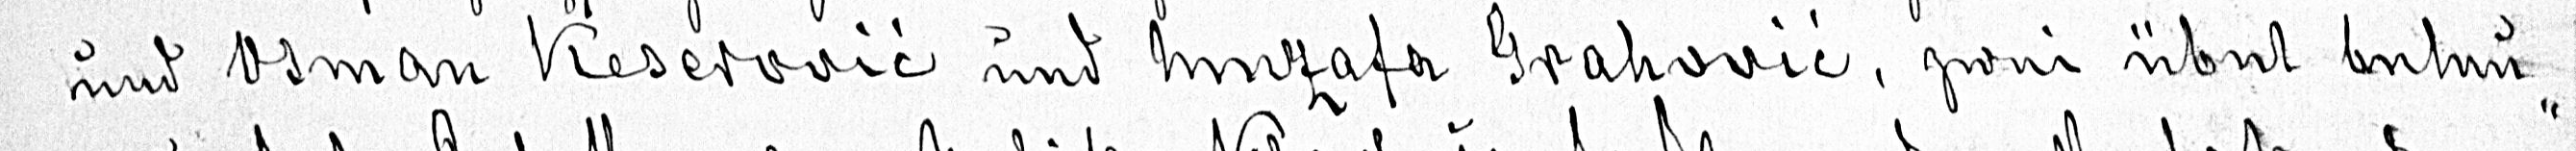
und Osman Keserović und Muzafa Grahović, zwei übel beleu¬
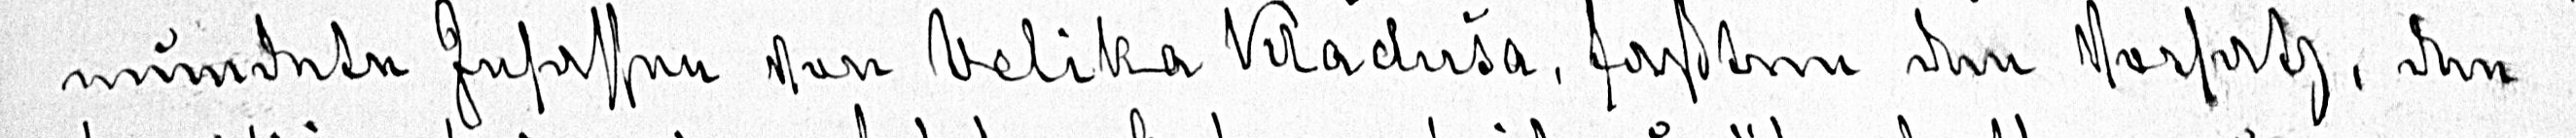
mundete Insassen von Velika Kladuša, faßten den Versatz, den
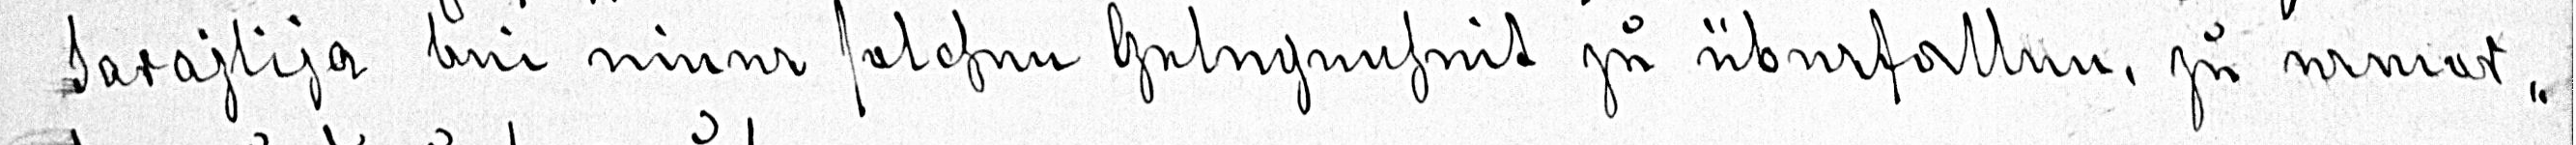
Savajlija bei einer solchen Gelegenheit zu überfallen, zu ermor¬
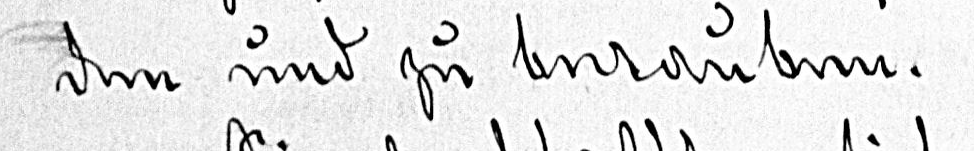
den und zu berauben.
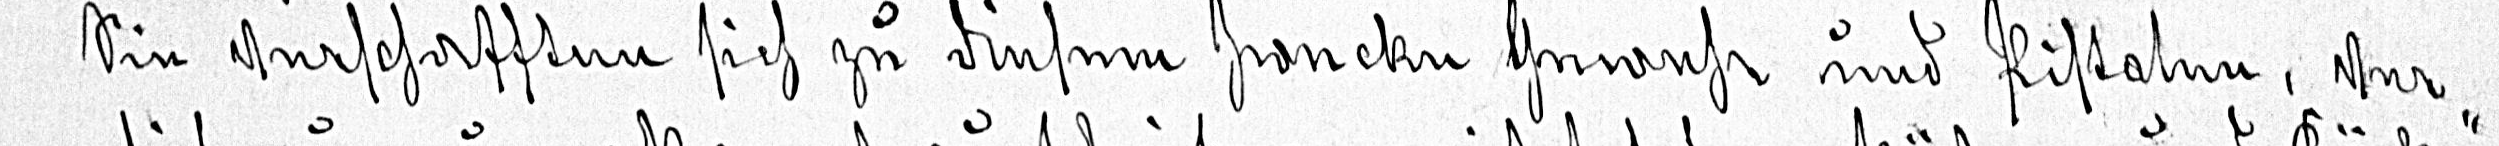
Sie Verschafften sich zu diesem Zwecke Gewehr und Pistolen, ver¬
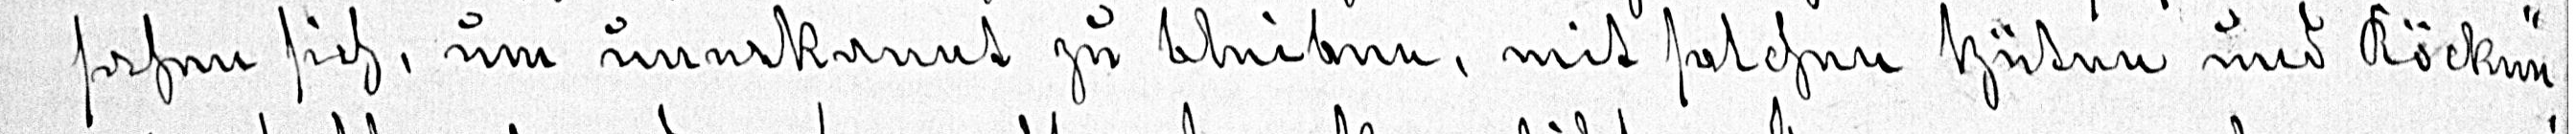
sahen sich, um unerkannt zu bleiben, mit solchen Hüten und Röcken,
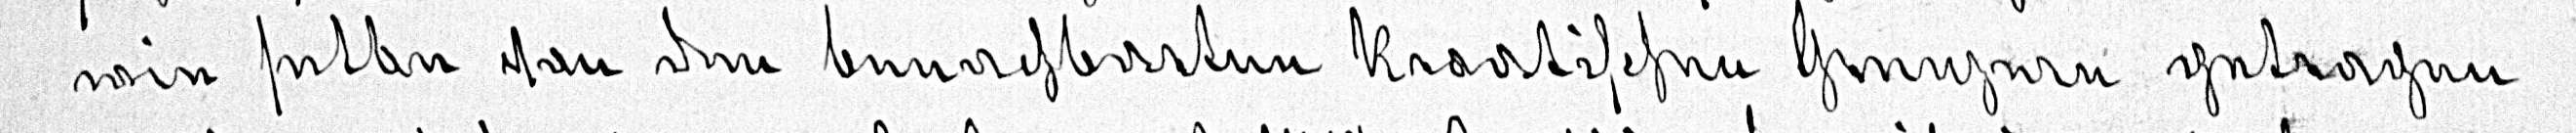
wie selbe von den benachbarten Kroatischen Grenzern getragen
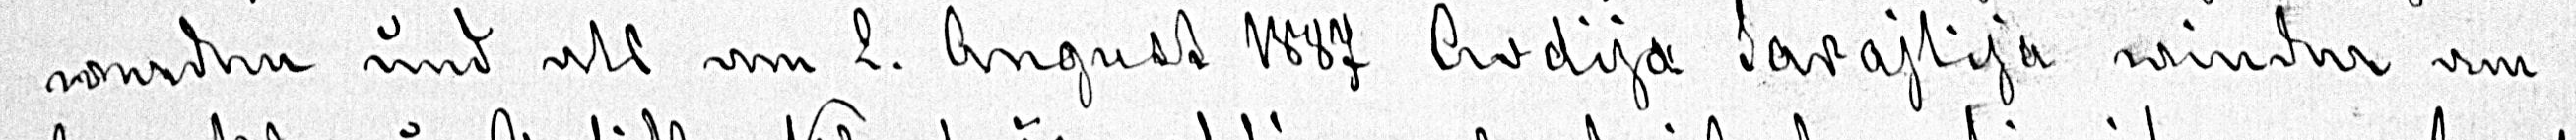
werden und als am 2. August 1887 Crodija Savajlija wieder am
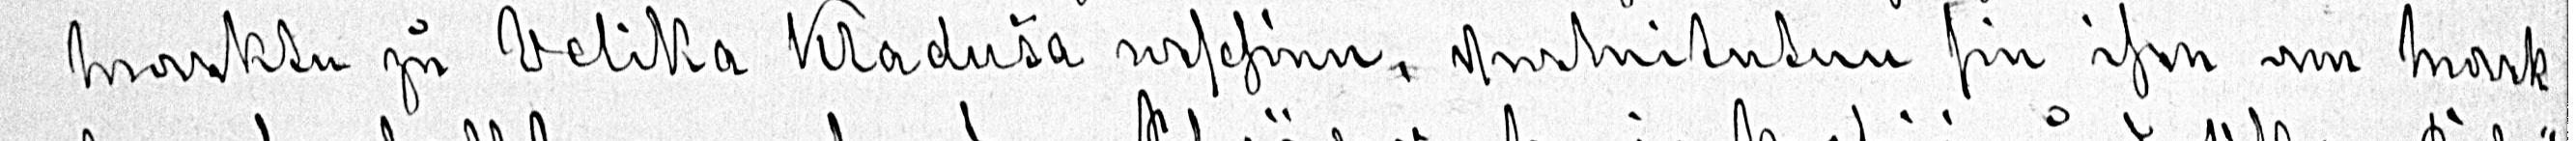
Markte zu Velika Kladuša erschien, Verteiteten sie ihre am Mark¬
